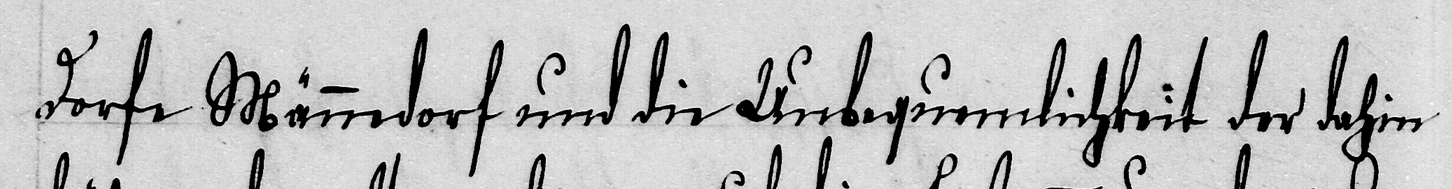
Dorfe Männedorf und die Unbequemlichkeit der dahin
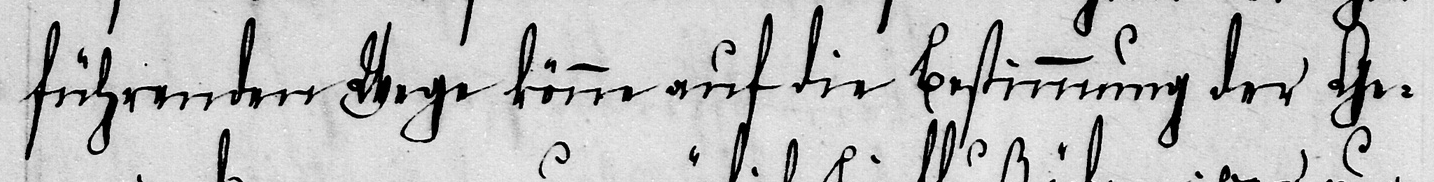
führenden Wege könne auf die Bestimmung der Ge¬
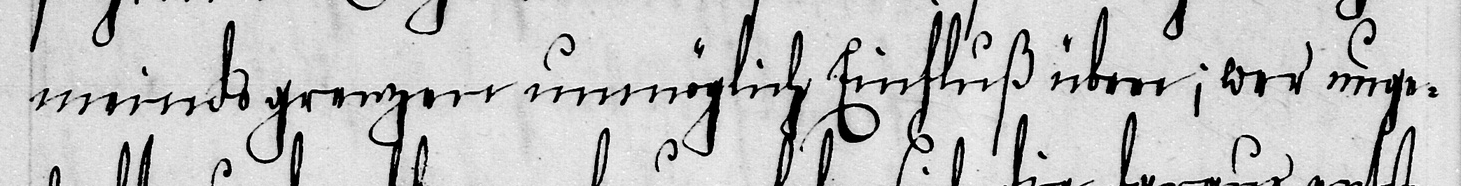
meindsgrenzen unmöglich Einfluß üben; wer unge¬
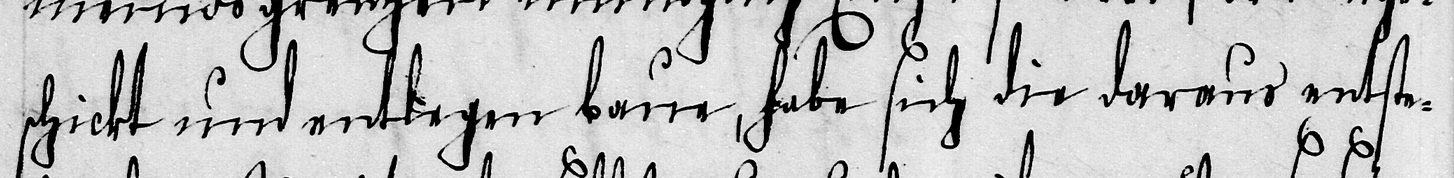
schickt und entlegen baue, habe sich die daraus entste¬
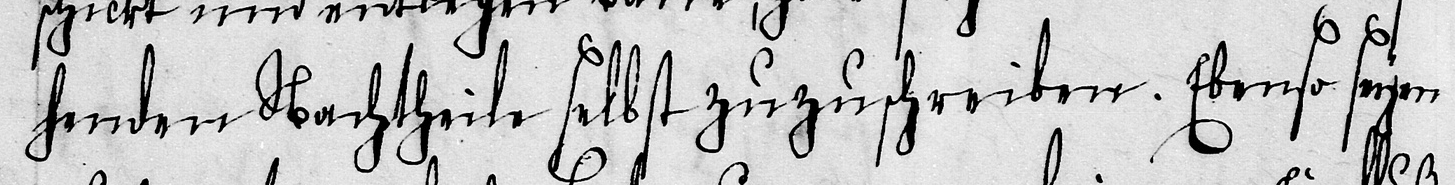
henden Nachtheile selbst zuzuschreiben. Ebenso seyen
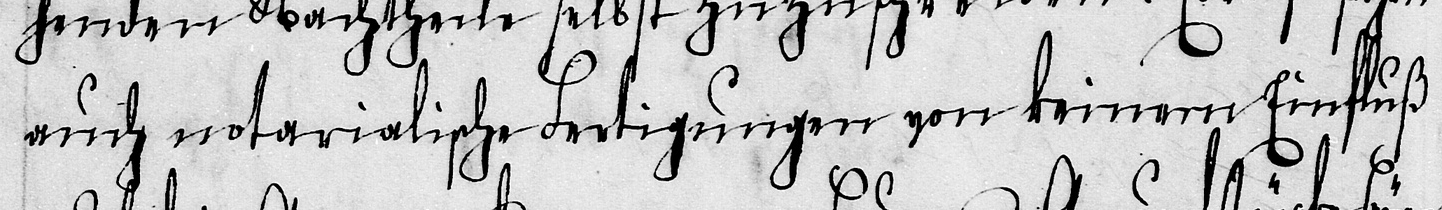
auch notarialische Fertigungen von keinem Einfluß
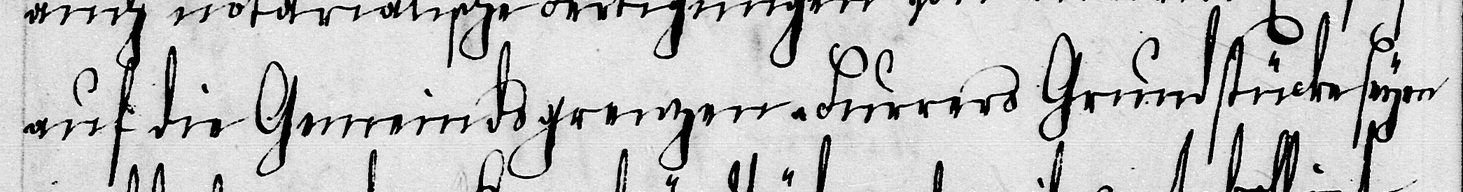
auf die Gemeindsgrenzen. Furrers Grundstücke seyen
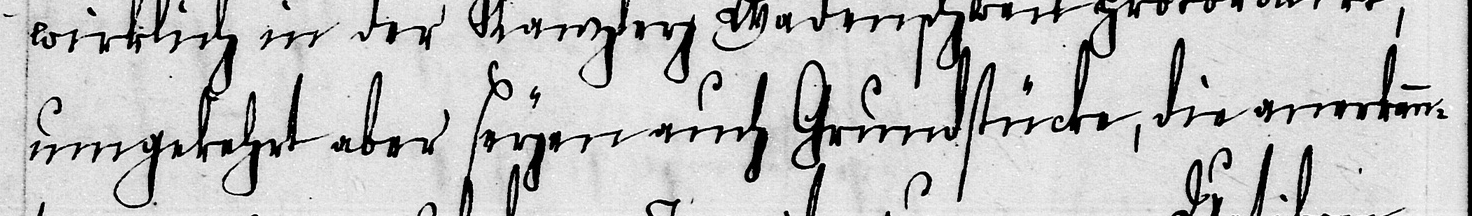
umgekehrt aber seyen auch Grundstücke, die anerkan¬
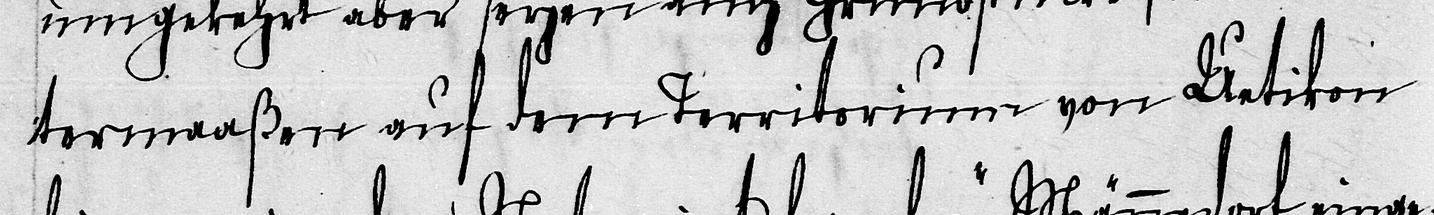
ntermaaßen auf dem Territorium von Uetikon
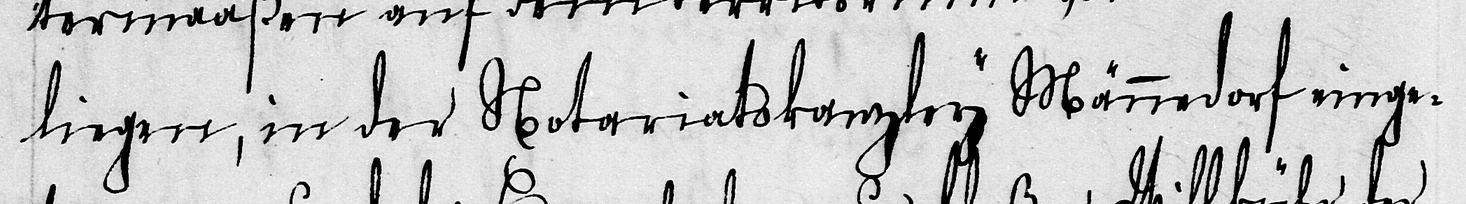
liegen, in der Notariatskanzley Männedorf einge¬
